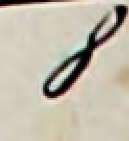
8
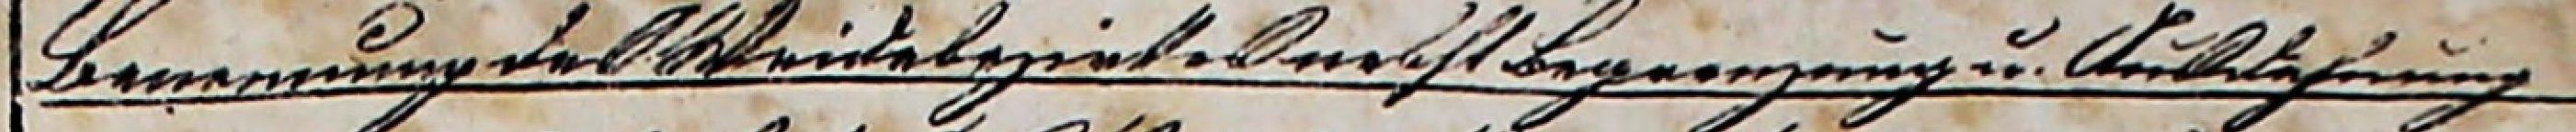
Benennung des Weidabezirkes nebst Begrenzung u. Ausdehnung
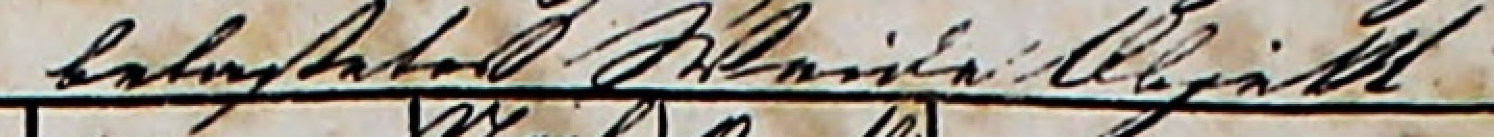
belaßetes Weide Objekt
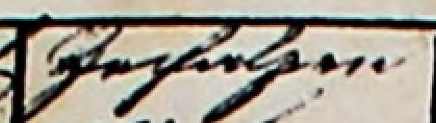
Zechalgen
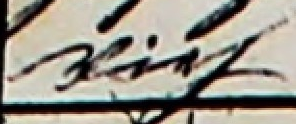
Vieh
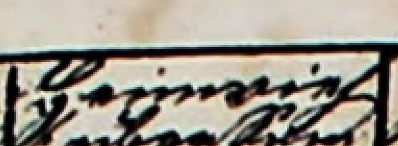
Heimvieh
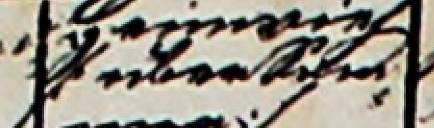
über S???
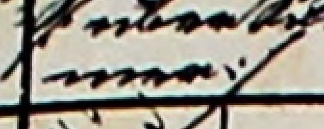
mer.
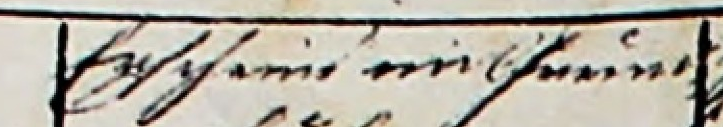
Erscheint im Grund„
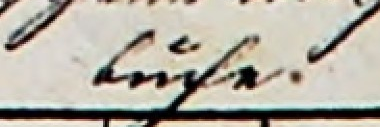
buche
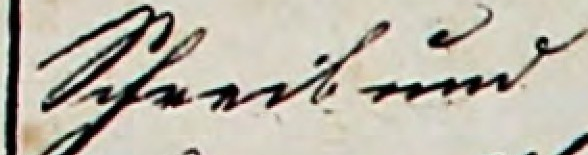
Schreib und
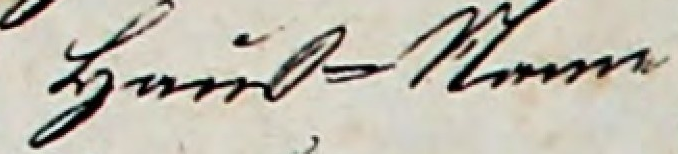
Haus=Name
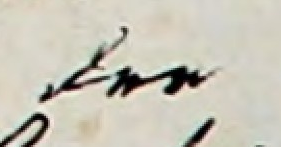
der
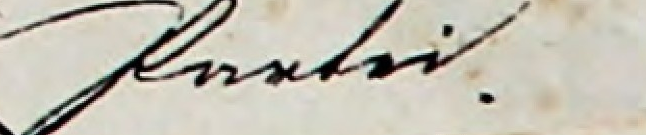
Partei
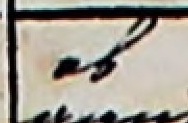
ob
